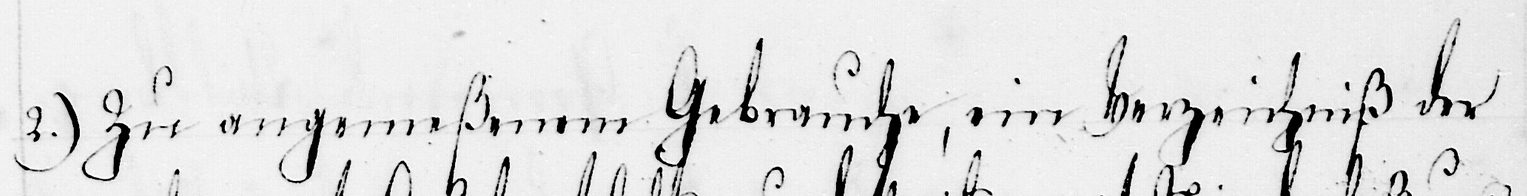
2.) Zu angemeßenem Gebrauche, ein Verzeichniß der
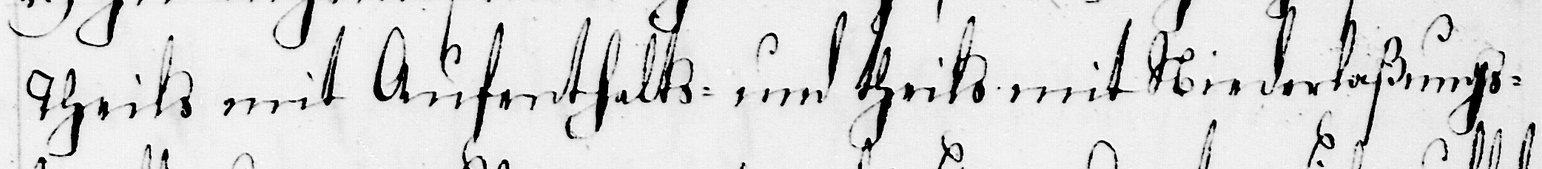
Theils mit Aufenthalts- und theils mit Niederlaßungs¬
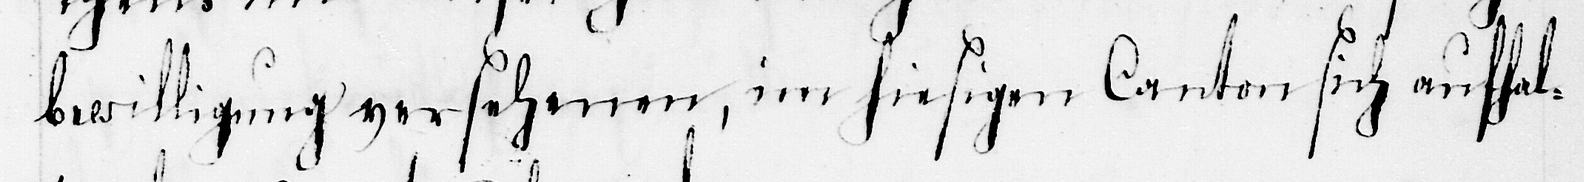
bewilligung versehenen, im hiesigen Canton sich aufhal¬
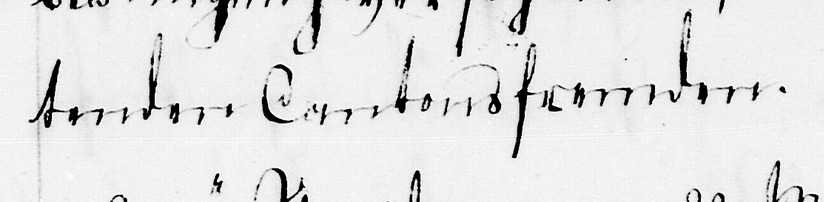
tenden Cantonsfremden.
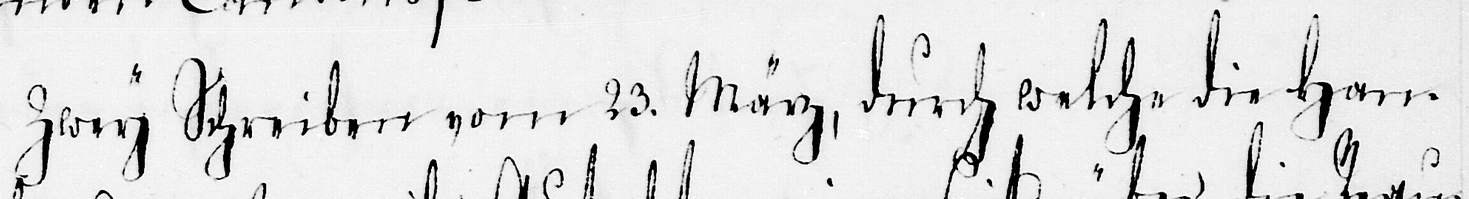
Zwey Schreiben vom 23. März, durch welche die Han¬
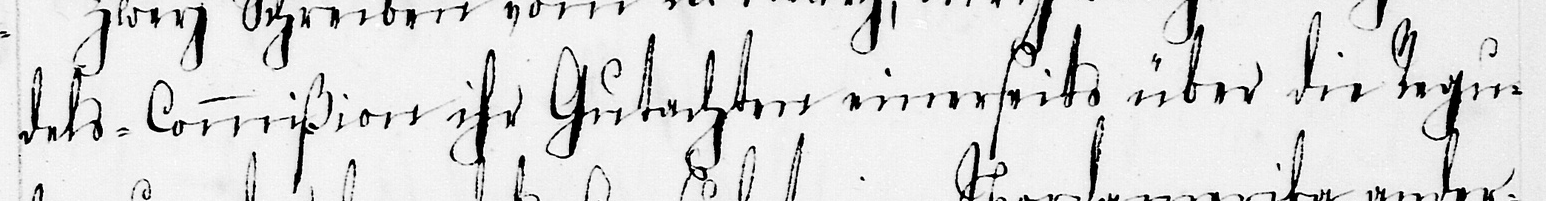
dels-Commißion ihr Gutachten einerseits über die Regu¬
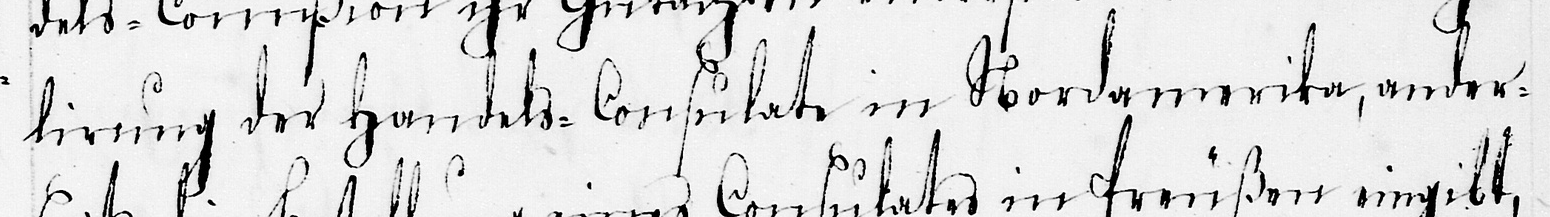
lirung der Handels-Consulate in Nordamerika, ander¬
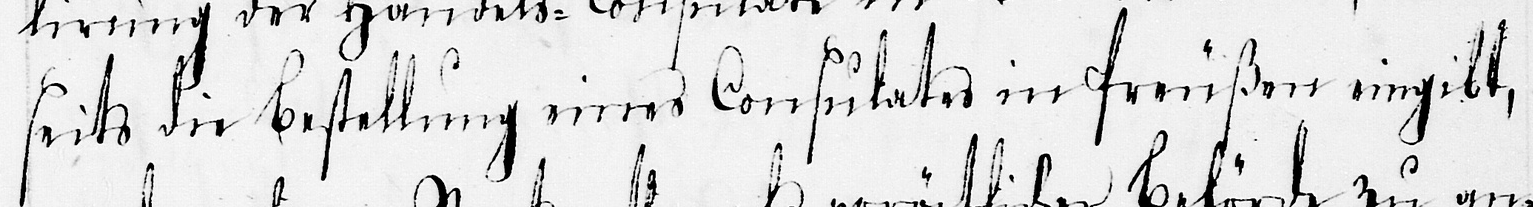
seits die Bestellung eines Consulates in Preußen eingibt,
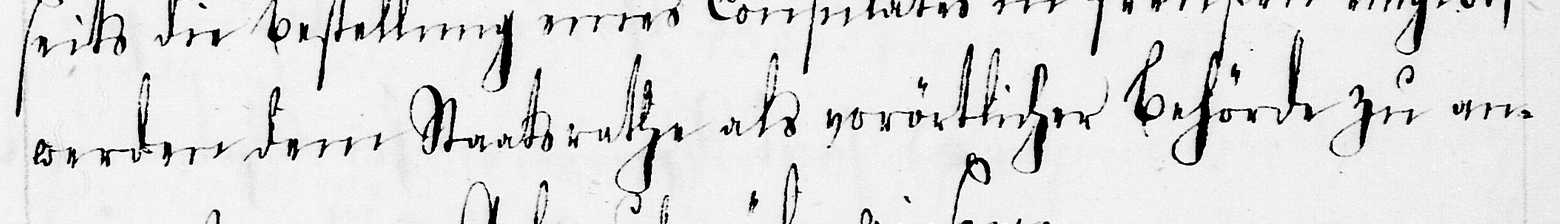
werden dem Staatsrathe als vorörtlicher Behörde zu an¬
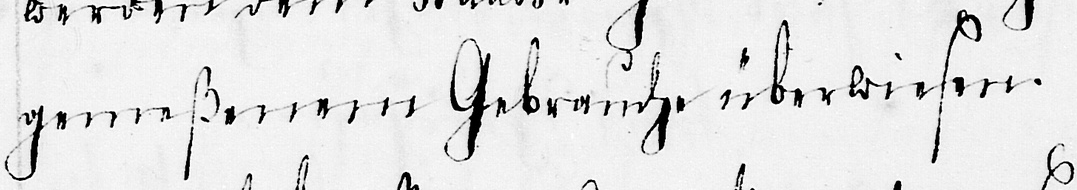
gemeßenem Gebrauche überwiesen.
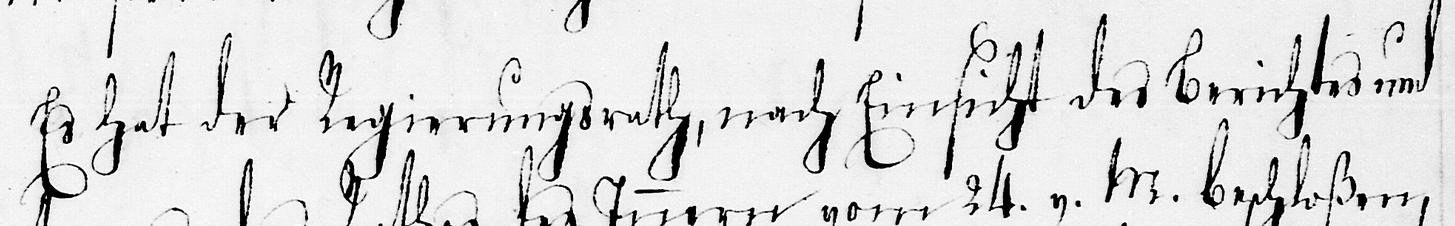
Es hat der Regierungsrath, nach Einsicht des Berichtes und
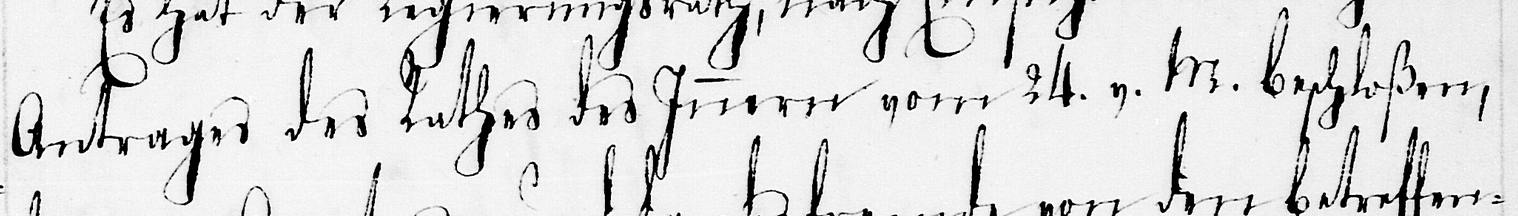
Antrages des Rathes des Innern vom 24. v. M. beschloßen,
